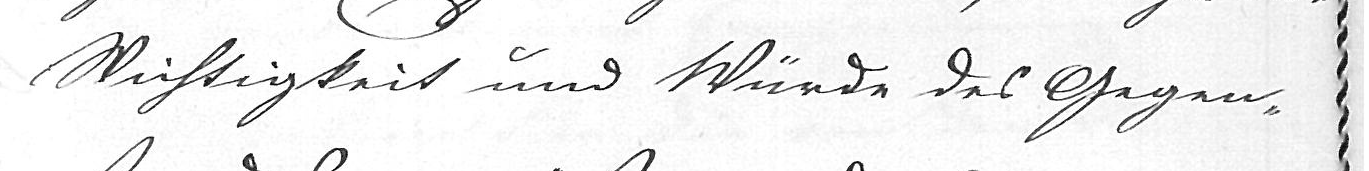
Wichtigkeit und Würde des Gegen-
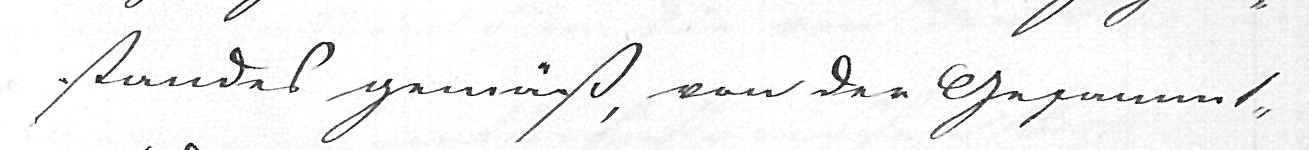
standes gemäß, von der Gesammt-
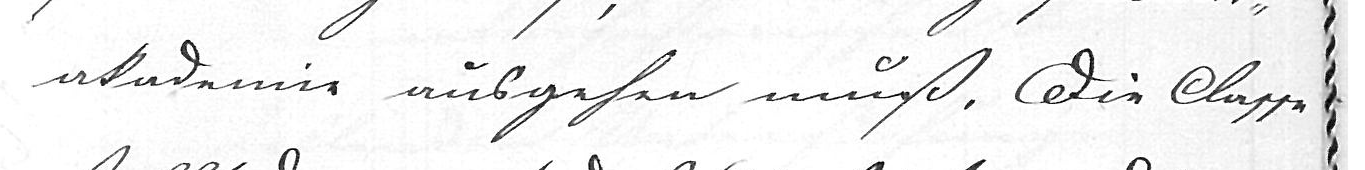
akademie ausgehen muß. Die Classe
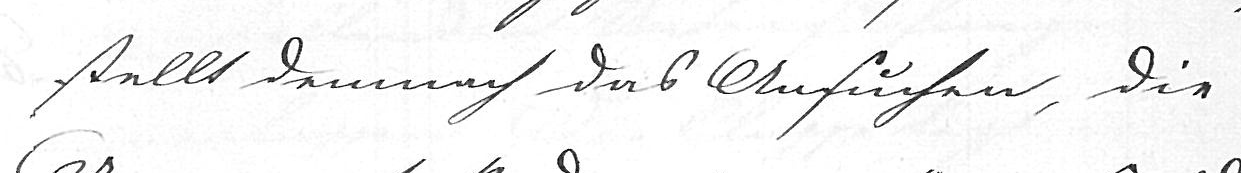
stellt demnach das Ansuchen, die
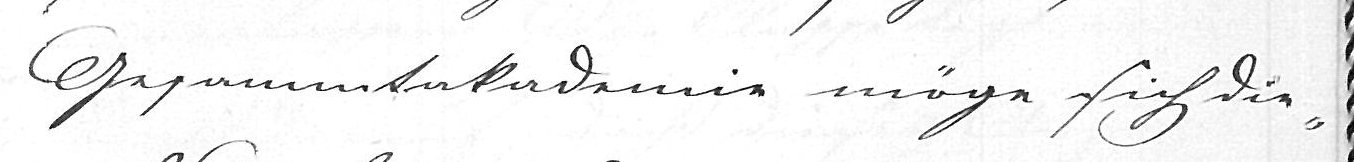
Gesammtakademie möge sich die-
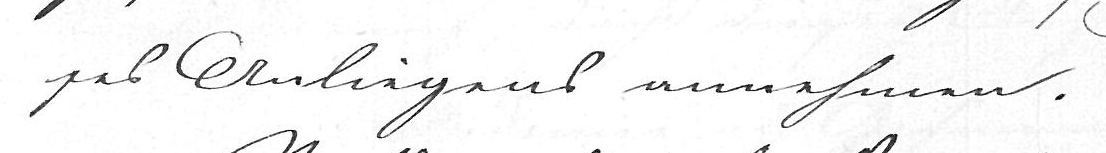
ses Anliegen annehmen.
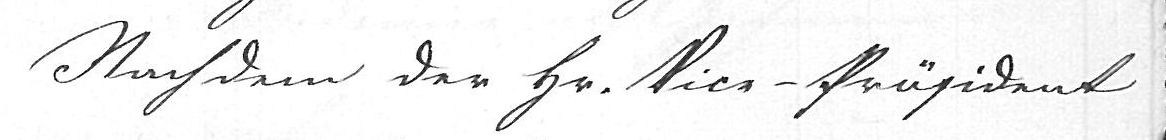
Nach dem der Hr. Vice-Präsident
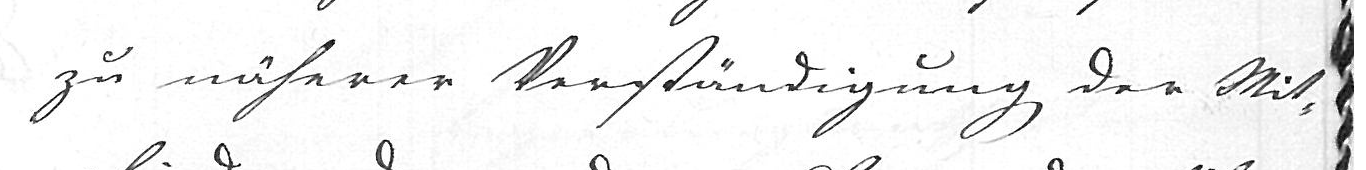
zu näherer Verständigung der Mit-
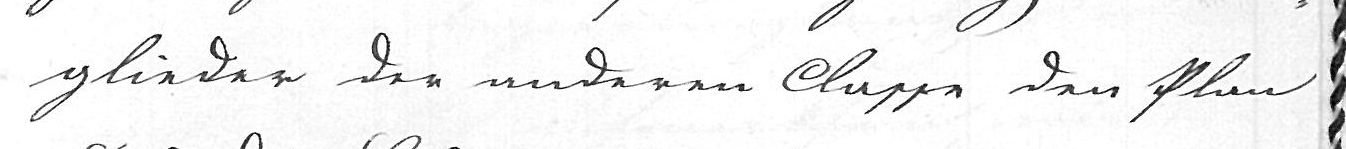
glieder der anderen Classe den Plan
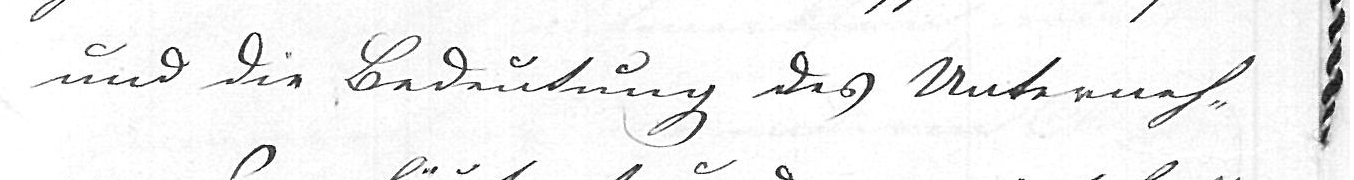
und die Bedeutung des Unterneh-
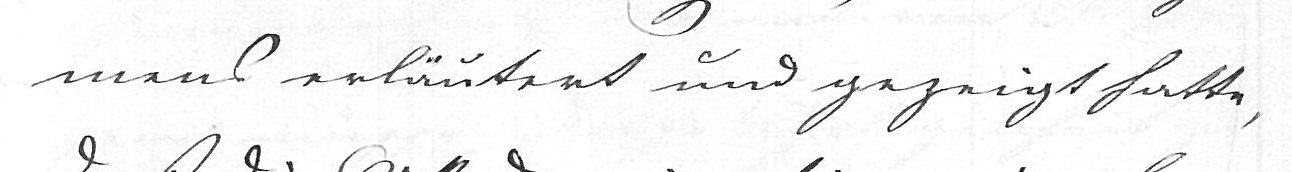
mens erläutert und gezeigt hatte,
